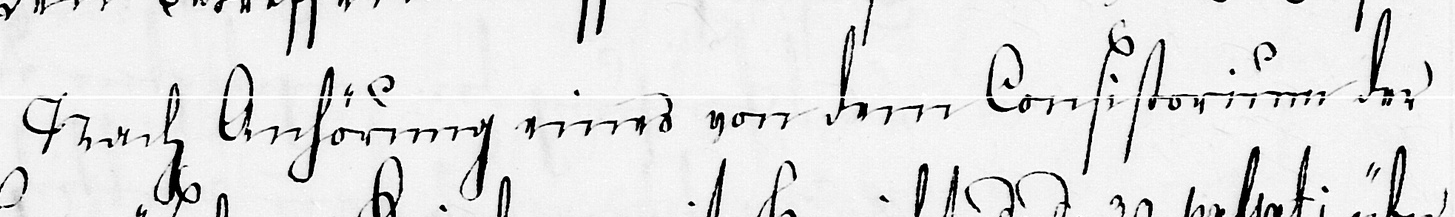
Nach Anhörung eines von dem Consistorium der
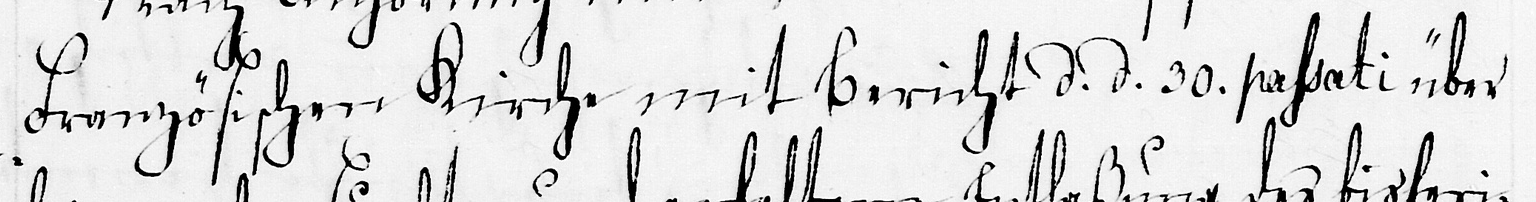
Französischen Kirche mit Bericht d. d. 30. passati über
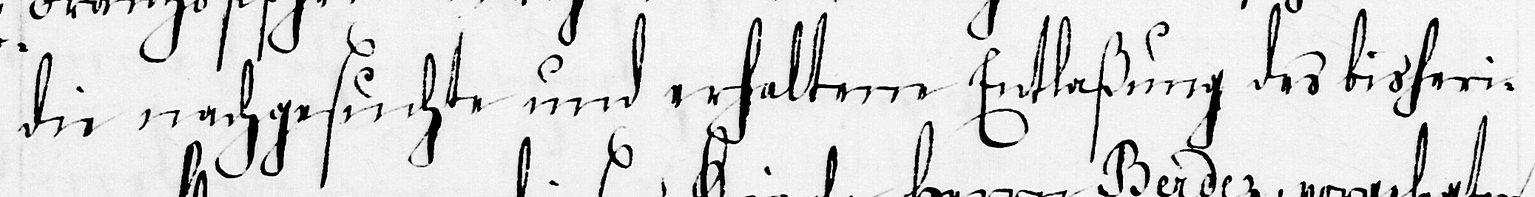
die nachgesuchte und erhaltene Entlaßung des bisheri¬
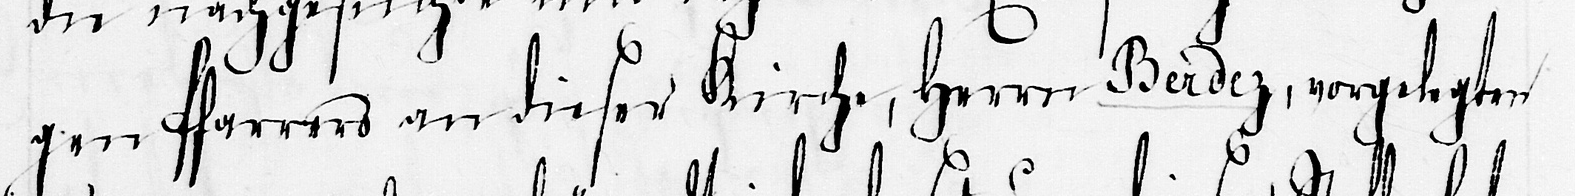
gen Pfarrers an dieser Kirche, Herrn Berdez, vorgelegten
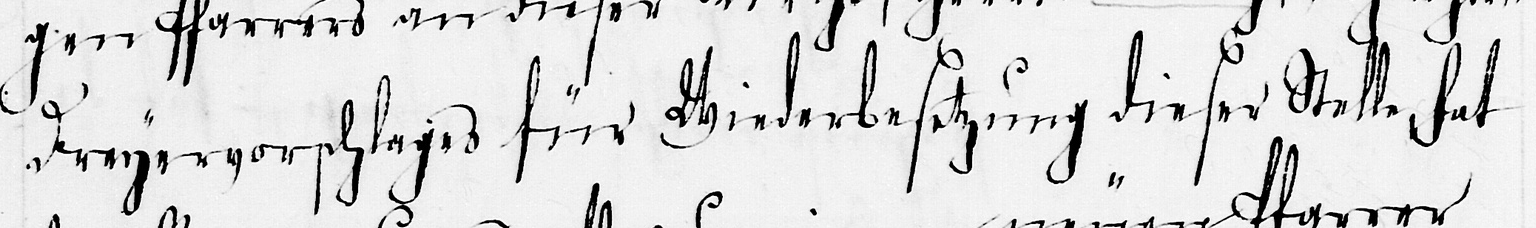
Dreyervorschlages für Wiederbesetzung dieser Stelle hat
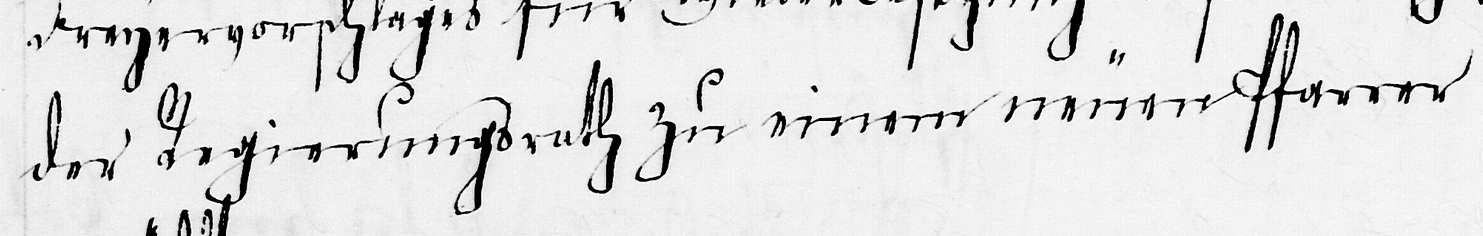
der Regierungsrath zu einem neuen Pfarrer
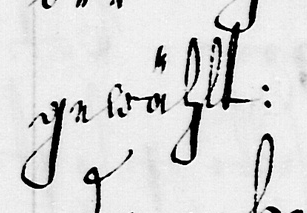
gewählt:
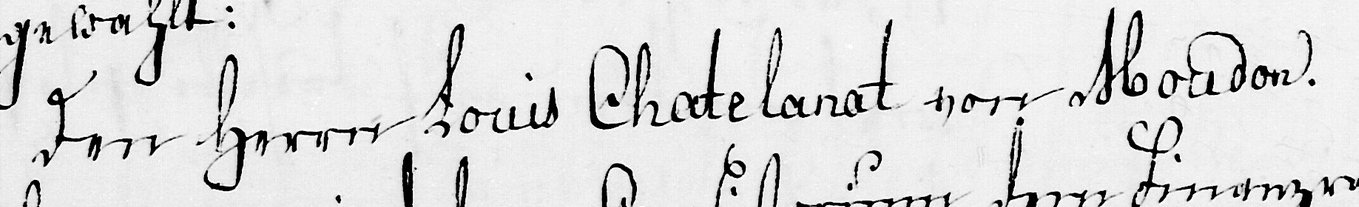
Den Herrn Louis Chatelanat von Moudon.
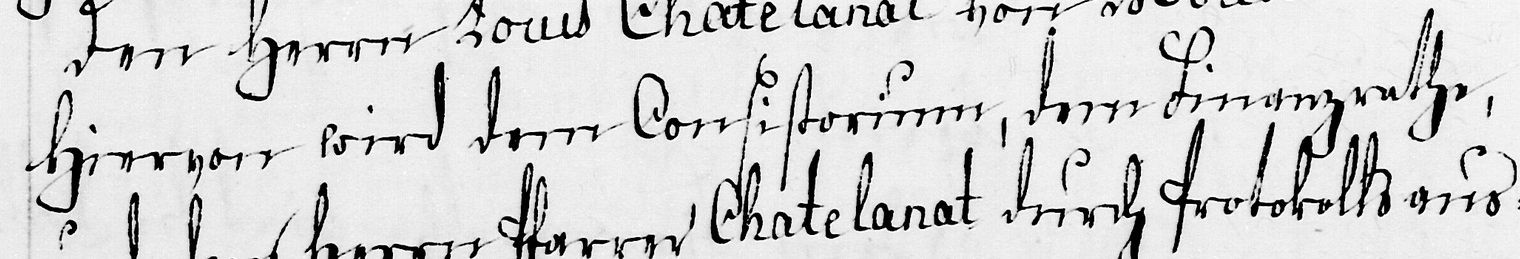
Hiervon wird dem Consistorium, dem Finanzrathe,
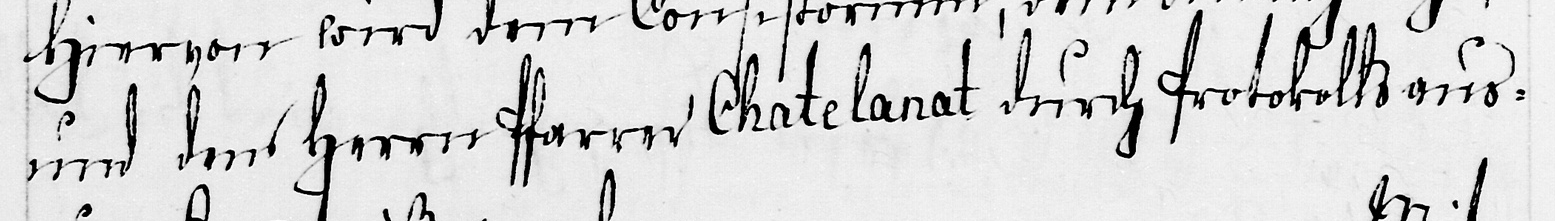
und dem Herrn Pfarrer Chatelanat durch Protokollsaus¬
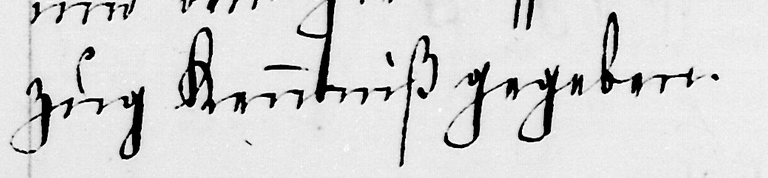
zug Kenntniß gegeben.
